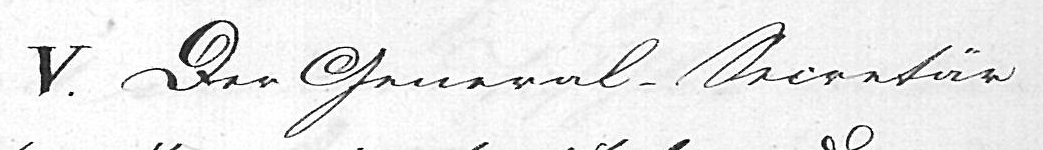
V. Der General-Secretär
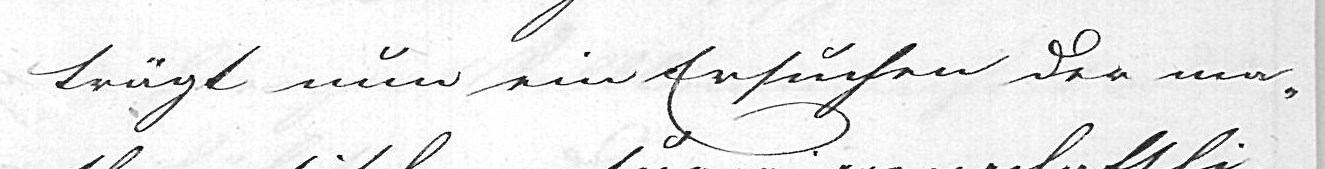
trägt nun ein Ersuchen der ma-
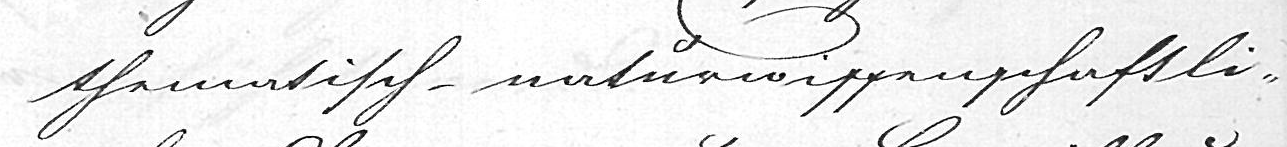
thematisch-naturwissenschaftli-
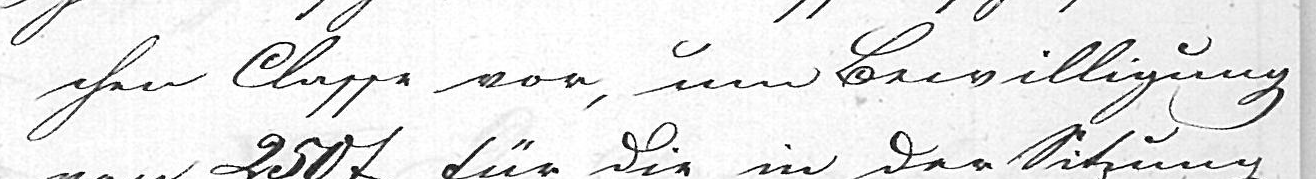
chen Classe vor, um Bewilligung
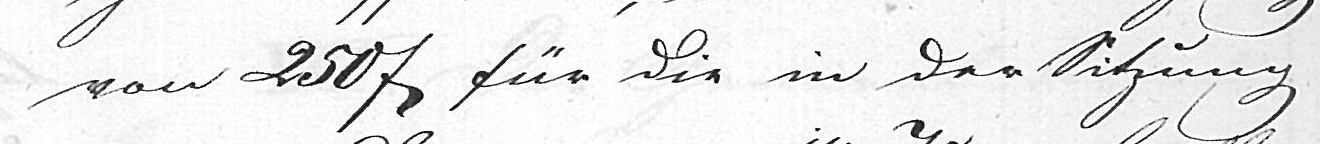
von 250 fl für die in der Sitzung
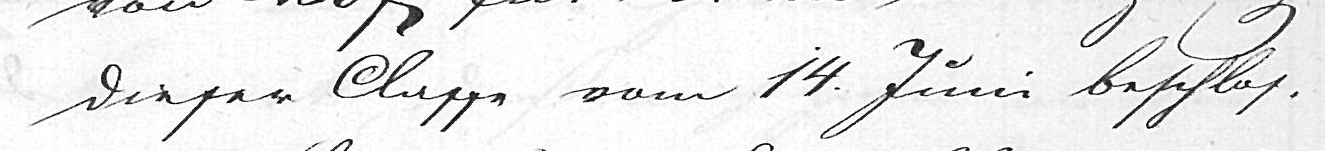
dieser Classe vom 14. Juni beschlos-
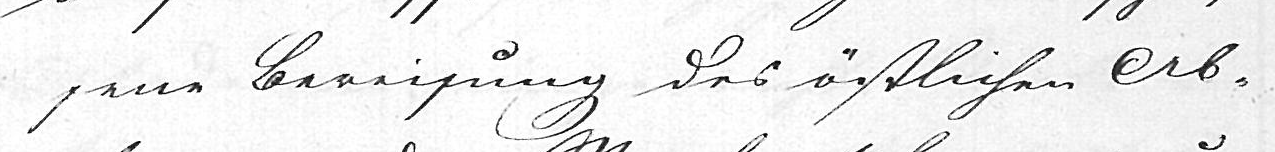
sene Bereisung des östlichen Ab-
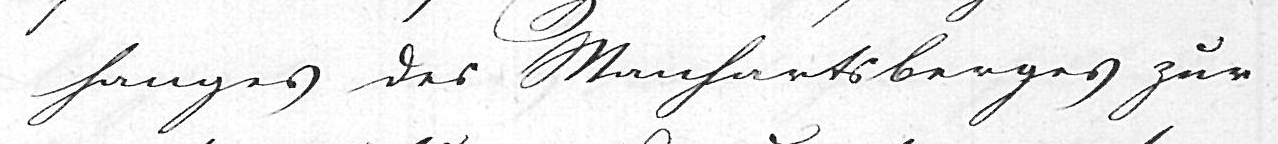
hanges der Manhartsberges zur
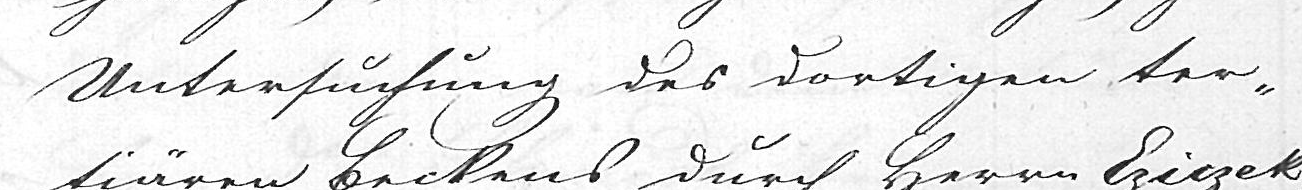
Untersuchung des dortigen ter-
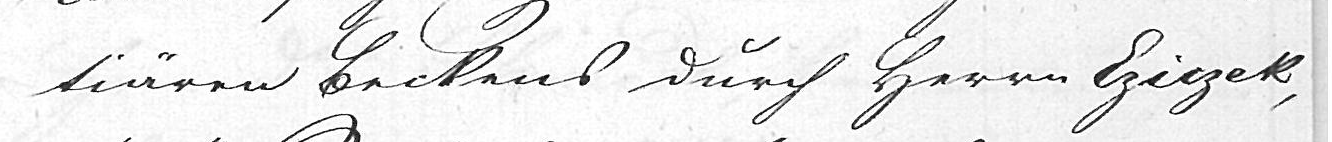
tiären Beckens durch Herrn Cziczek,
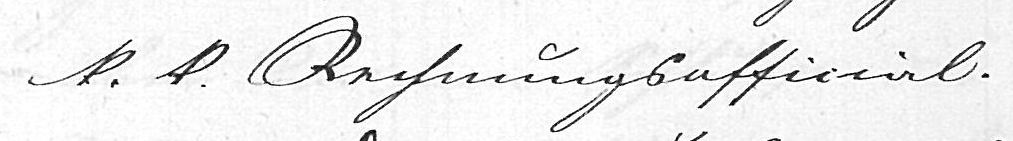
k. k. Rechnungsofficial.
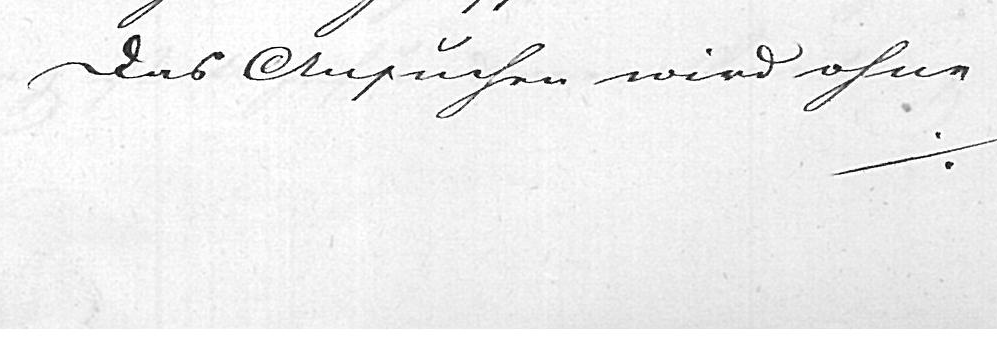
Das Ansuchen wird ohne
